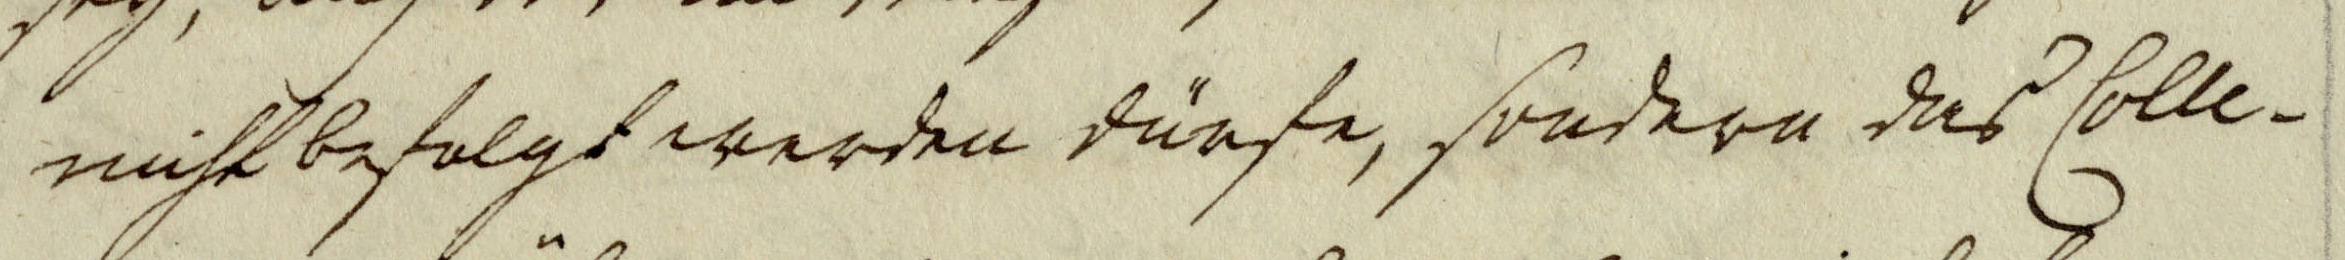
nicht befolgt werden dürfe, sondern das Colle¬
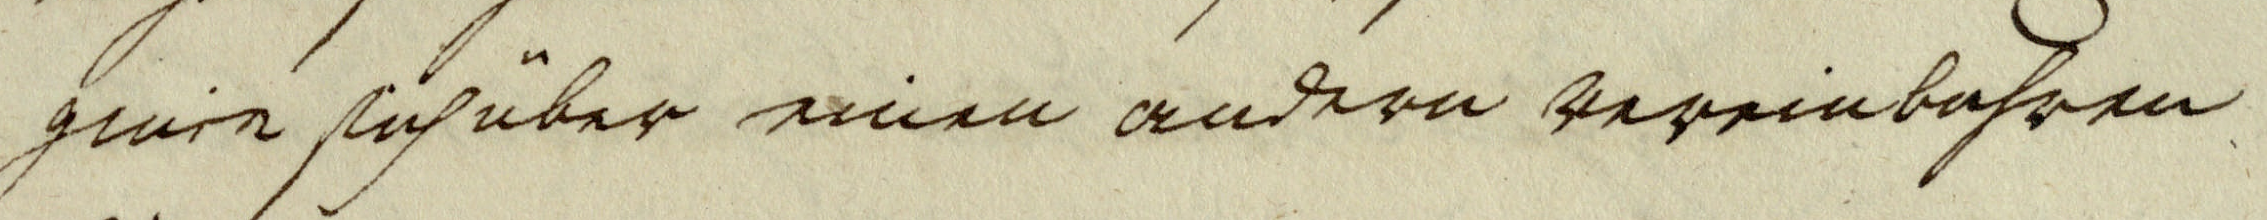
gium sich über einen andern vereinbahren
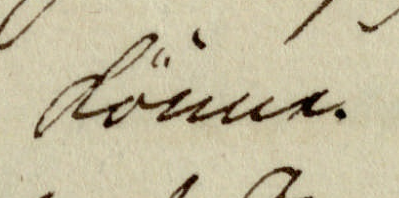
könne.
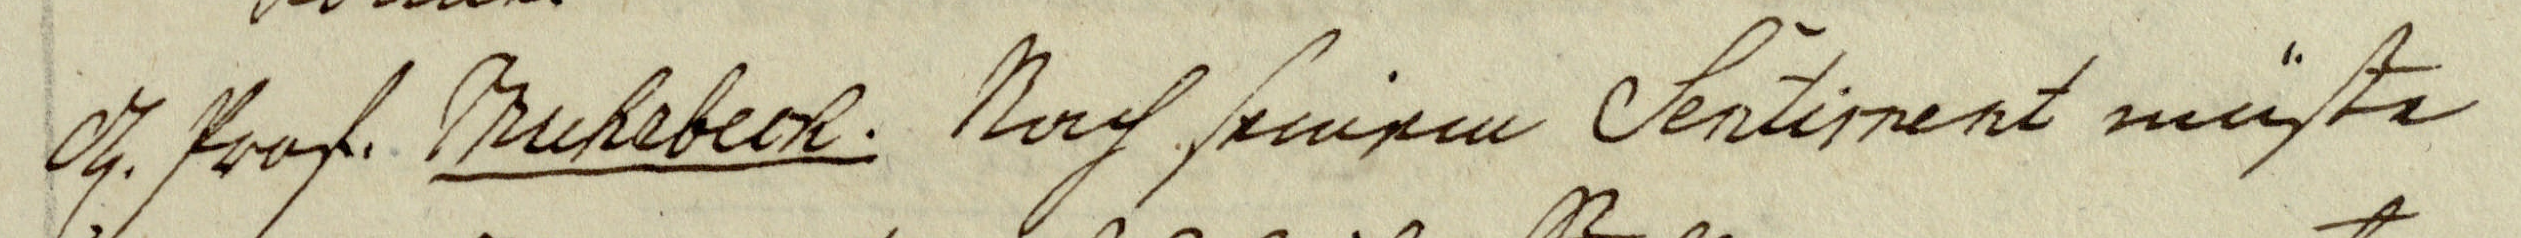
dh. Prof. Muhrbeck. Nach seinem Sentiment müsste
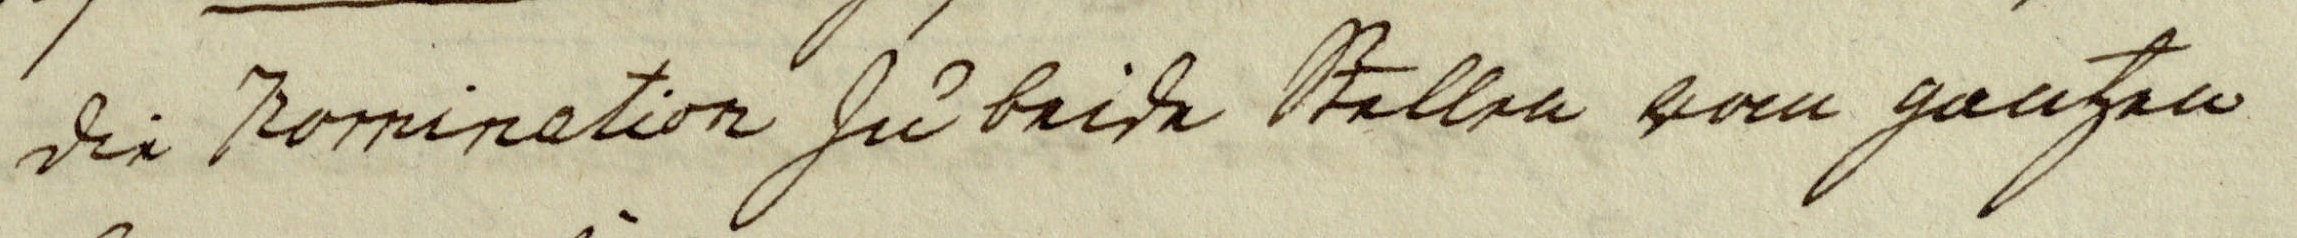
die Nomination zu beide Stellen vom gantzen
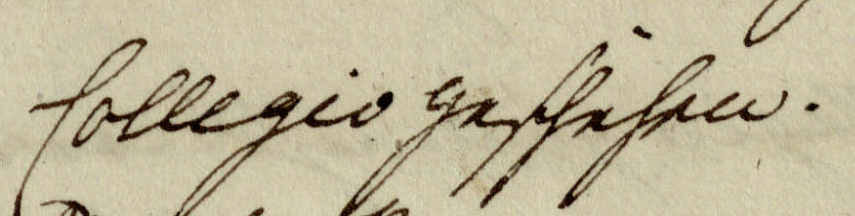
Collegio geschehen.
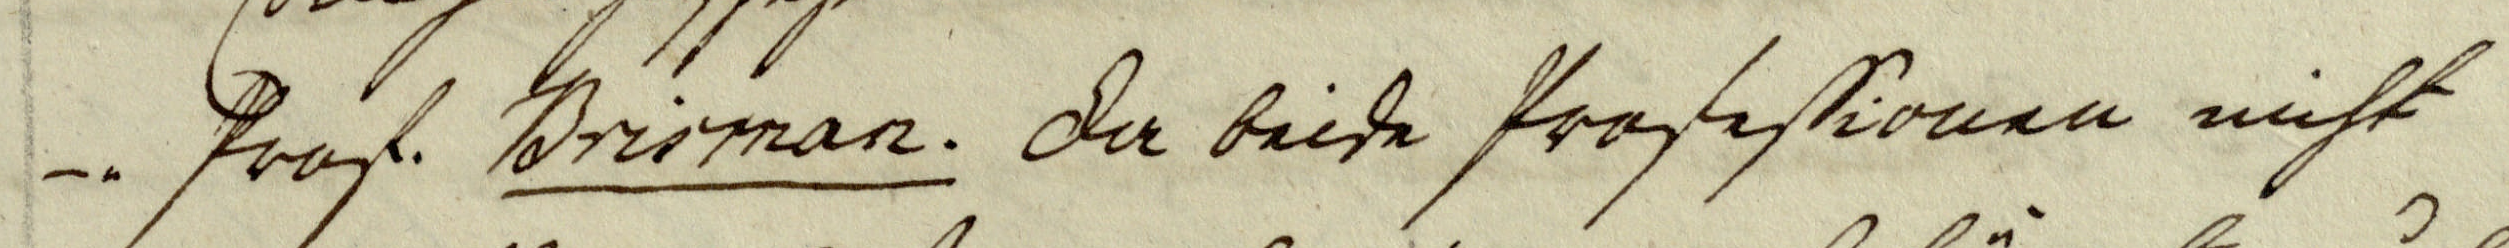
— " Prof. Brisman. Da beide Professionen nicht
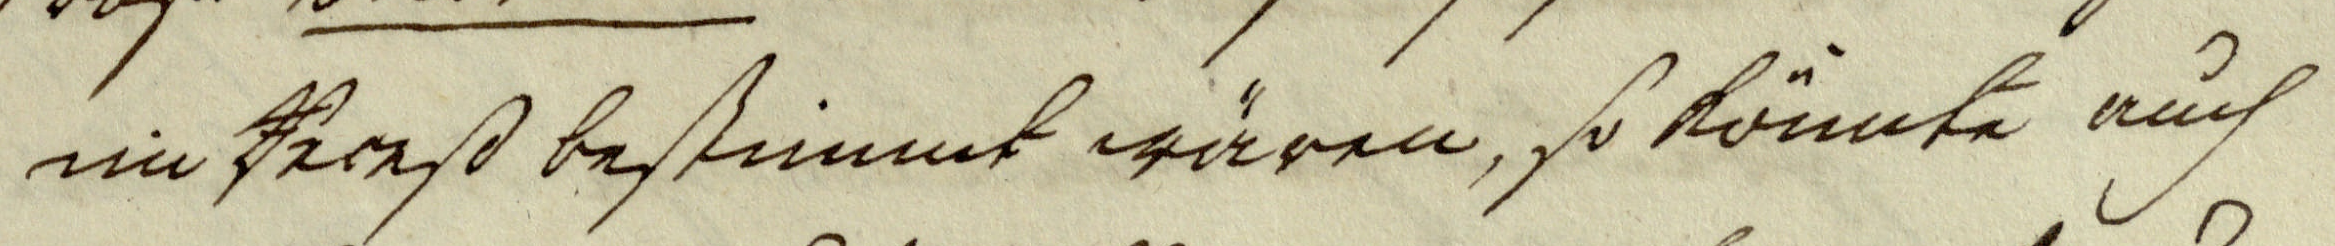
im Receß bestimmt wären, so könnte auch
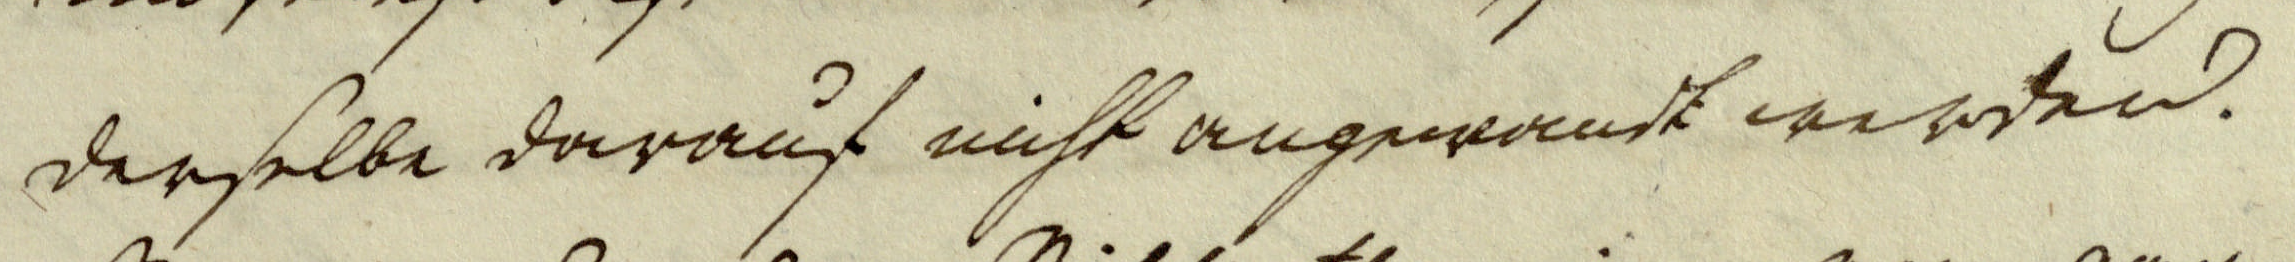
derselbe darauf nicht angewandt werden.
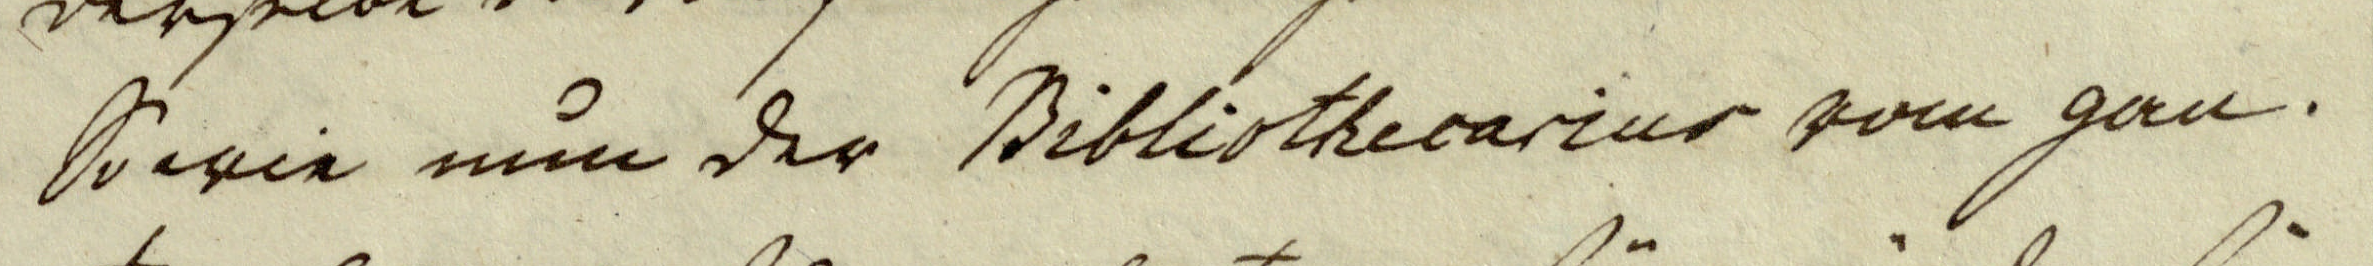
So wie nun der Bibliothecarius vom gan¬
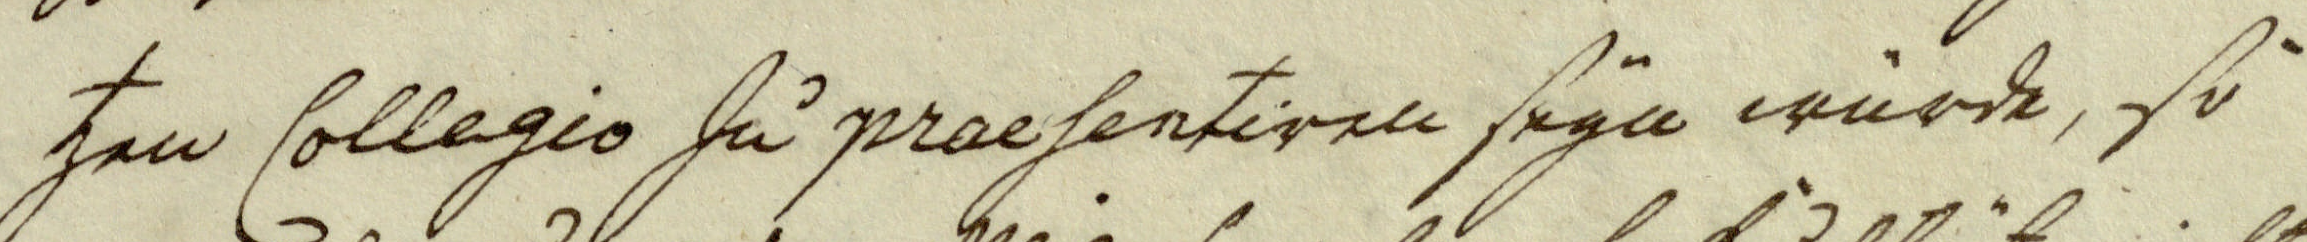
tzen Collegio zu praesentiren seÿn würde, so
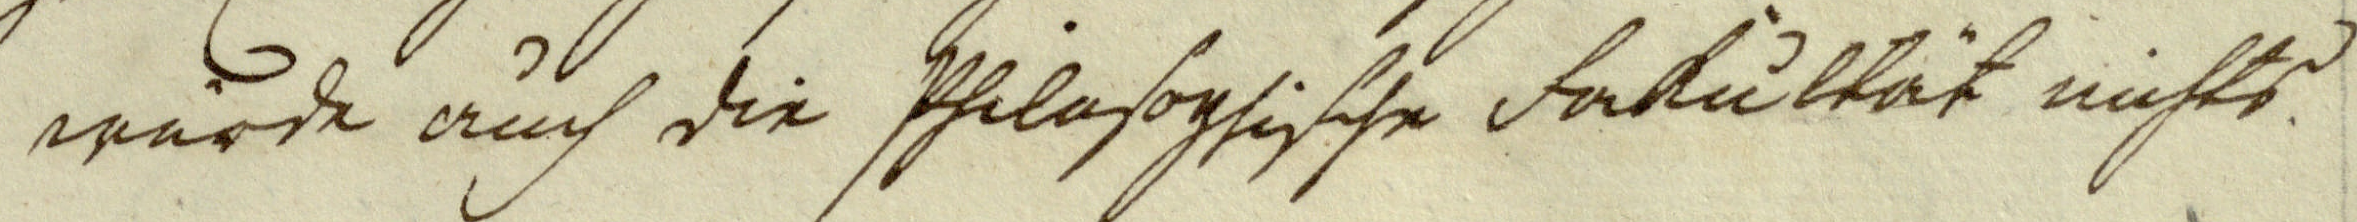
würde auch die Philosophische Fakultät nichts
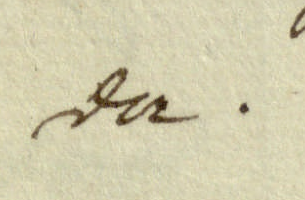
da¬
